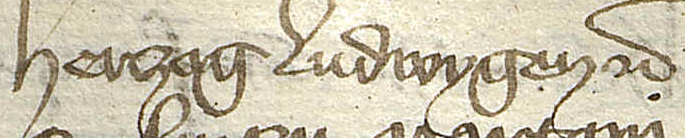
Hercʒog Luwdygen ec*
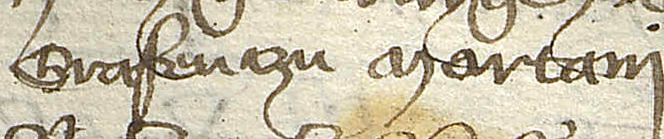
Grafen cʒu Mortani
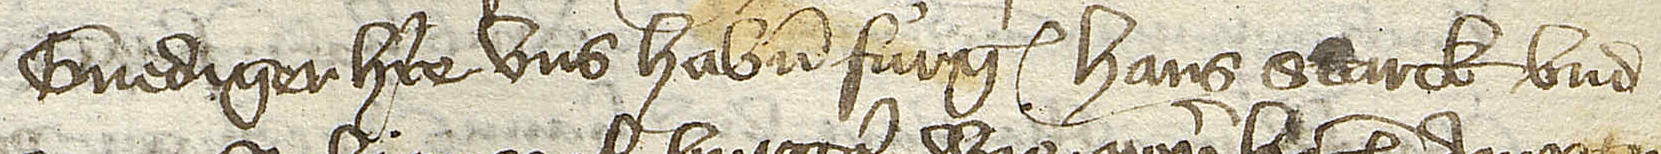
Gnediger hre* vns hab*n fürg* hans Starck vnd
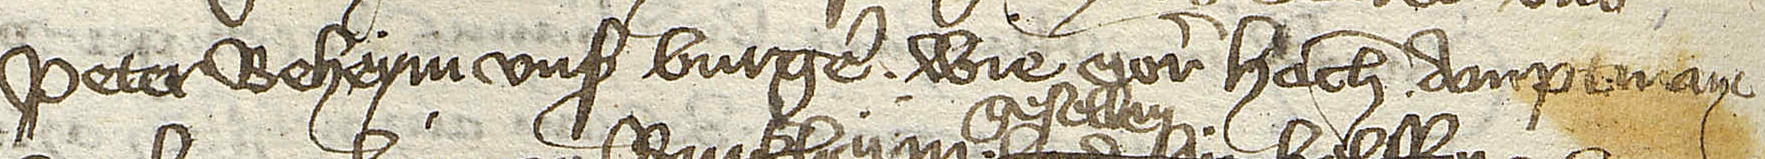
Peter Beheym vnſ* burge* . wie ewr* hoch* Amptman*
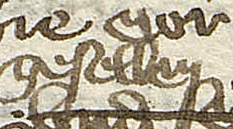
geſellen
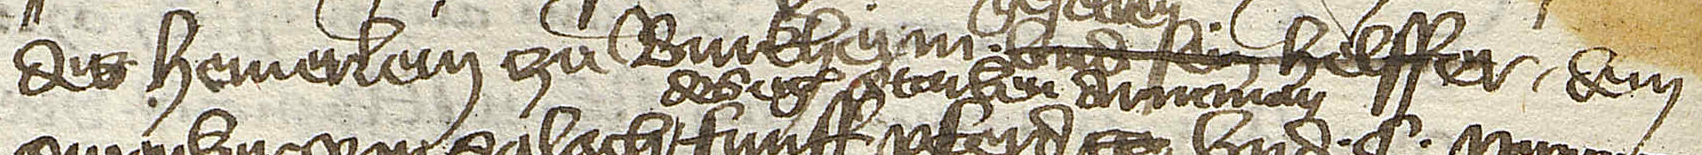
des hemerlein cʒu Burkheim vnd ſein helffer / dem
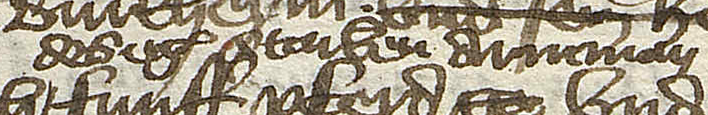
des eg* Starken Armman
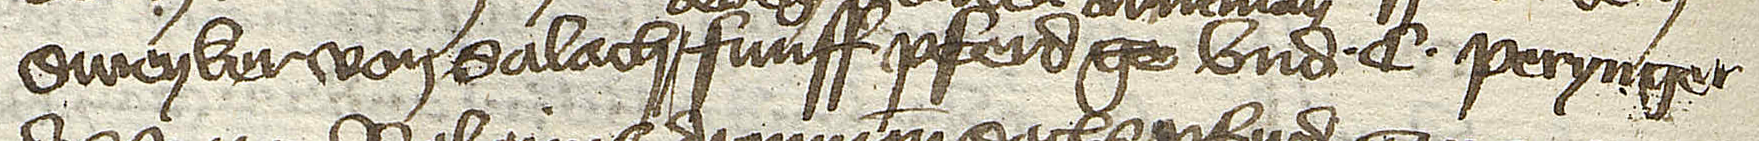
Sweyker von Salach funff pferd ge vnd . C . perynger
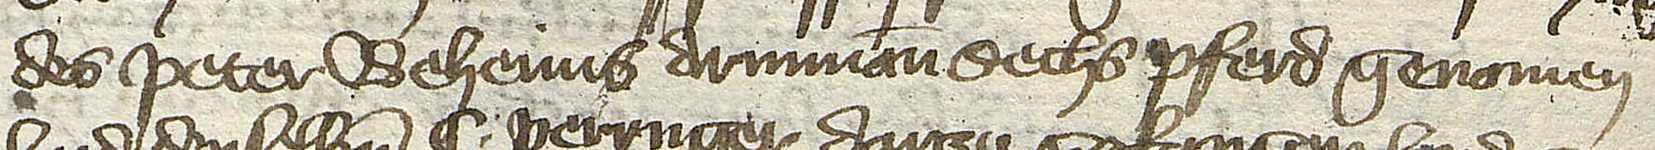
des Peter Beheims Armman* sechs pferd genomen
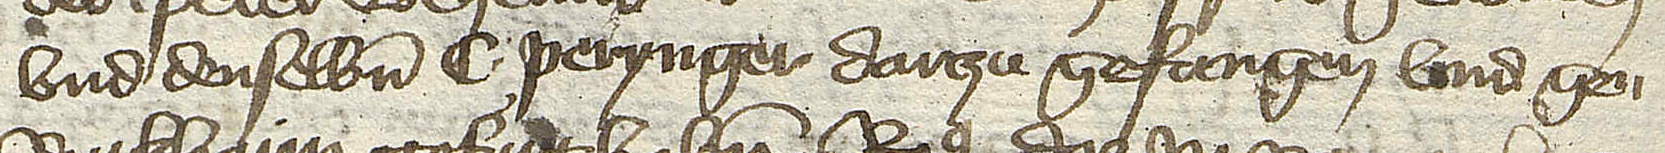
vnd denſelb*n C . perynger darcʒu gefangen vnd gen
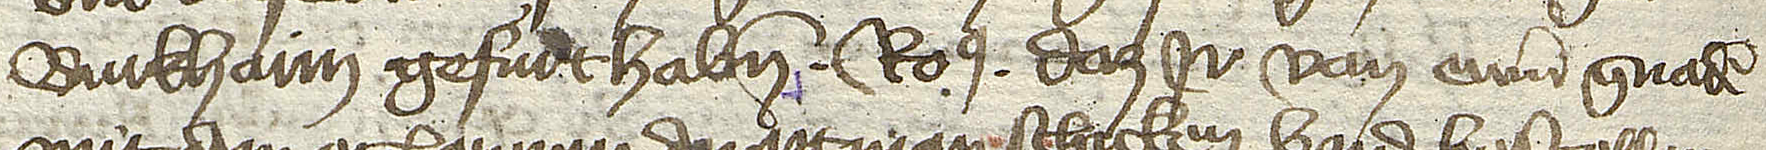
Burkhaim gefürt hab*n . Ro* daʒ Ir von ewn* gnade*
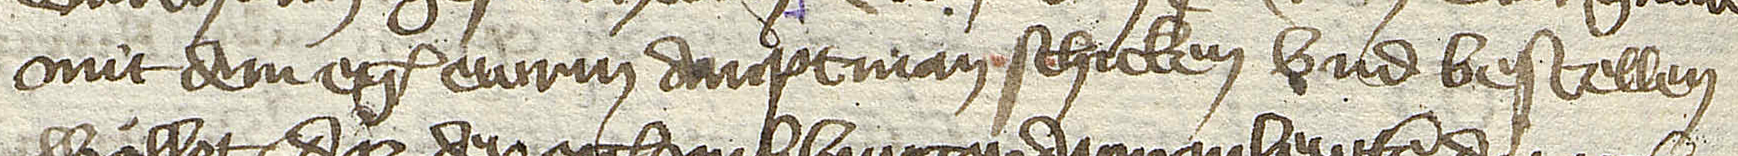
mit dem eg* ewrm Amptman ſchicken vnd beſtellen
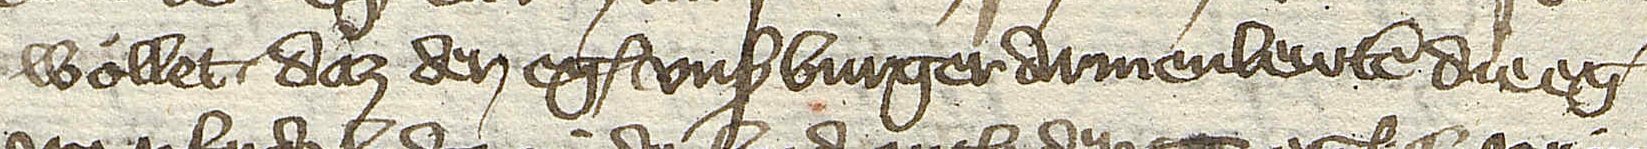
wöllet / daʒ den eg* vnſ* burger Armenlewte* die eg*
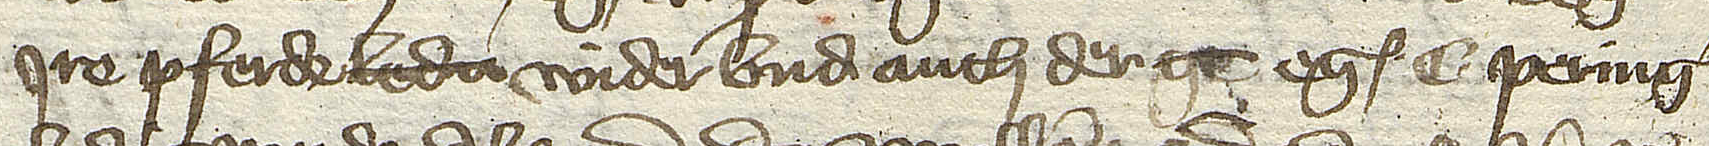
Ire pferde ledi wider vnd auch der ge eg* . C . pering*
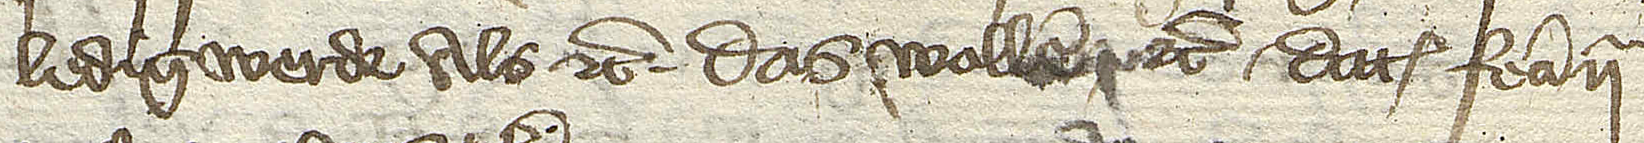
ledig werde Als ec* . Das wolle* ec* / dat* fea* ii*
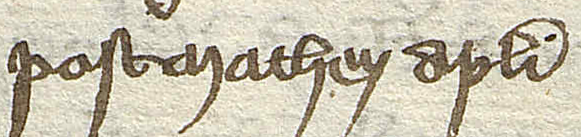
poſt Mathey Apli*
